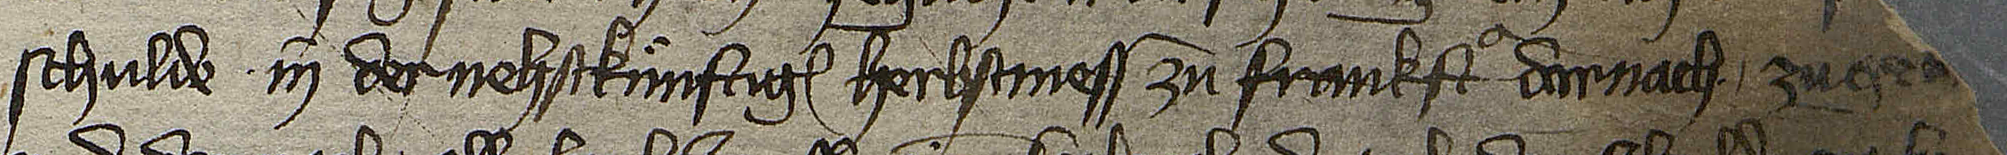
ſchulde . in der nehſtkünftig* Herbſtmeſſ ʒu frankf*t darnach / ʒu geb
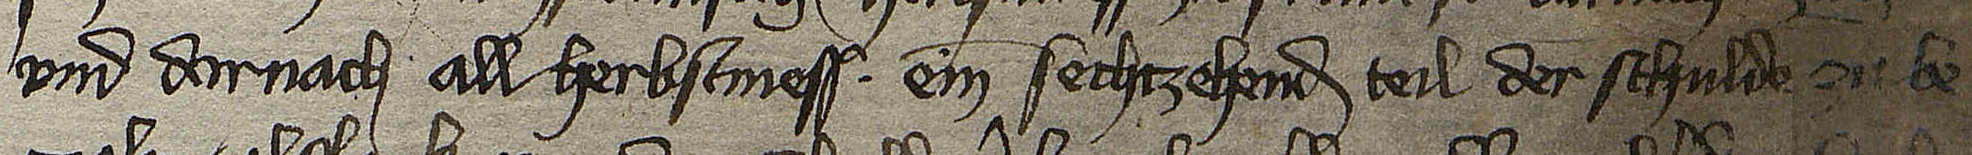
vnd darnach all herbſtmeſſ . ein* ſechcʒehend* teil der ſchulde ʒu be
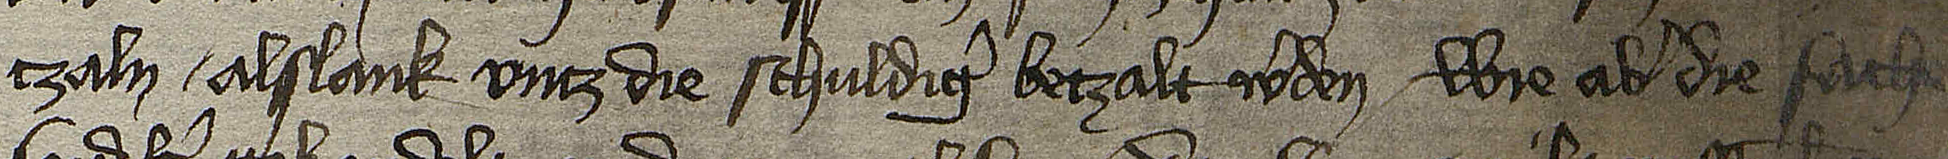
cʒaln / alſlank vncʒ die ſchuldig* becʒalt w*den / wie ab* die ſache
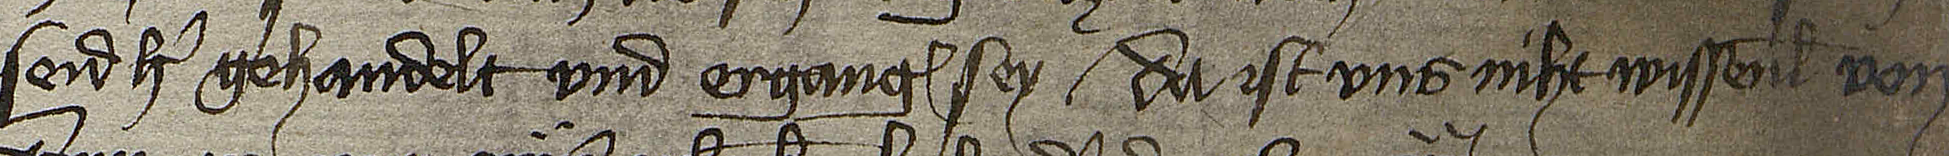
ſeidh* gehandelt vnd ergang* ſey / Da iſt vns niht wiſſenl* von
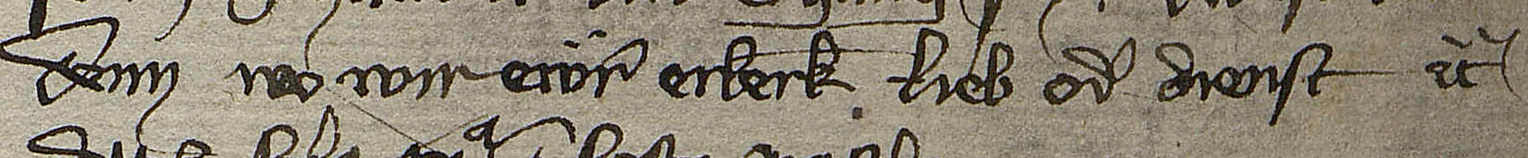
Denn wo wir ewr* erberk* lieb od* dienſt ec*
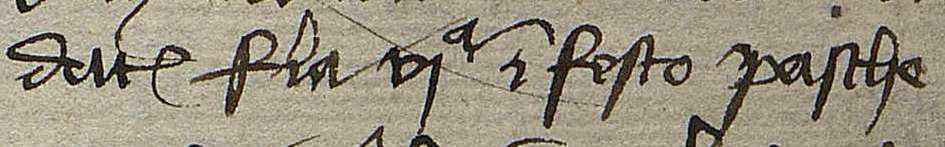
Dat* fi*a vi* i* feſto Paſche
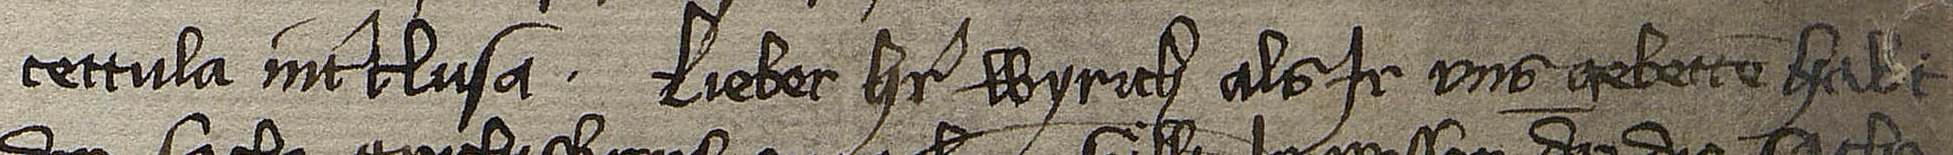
cettula int*cluſa . Lieber hr* wyrich als Ir vns gebette* habt
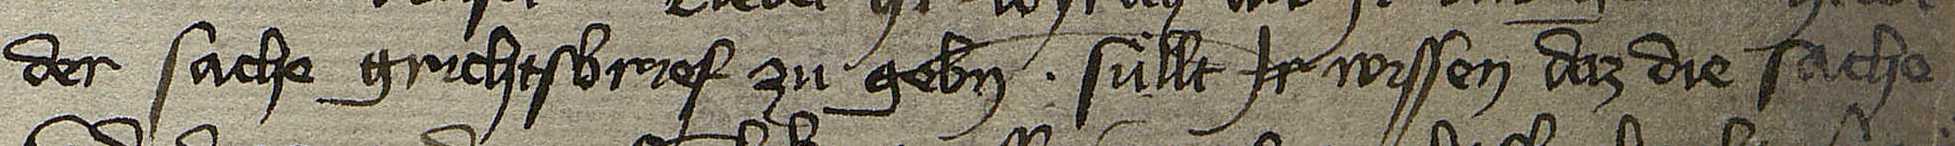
der ſache grichtſbrief ʒu gebn* . ſüllt Ir wiſſen daʒ die ſache
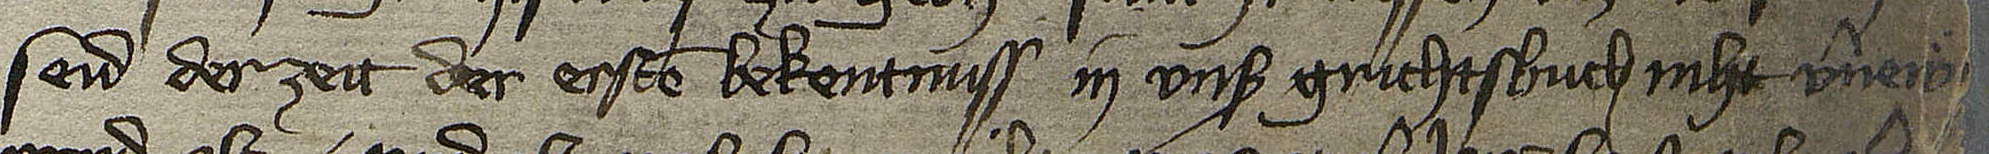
ſeid der ʒeit der erſte* bekentnuſſ in vnſ* grichtſbuch niht v*new
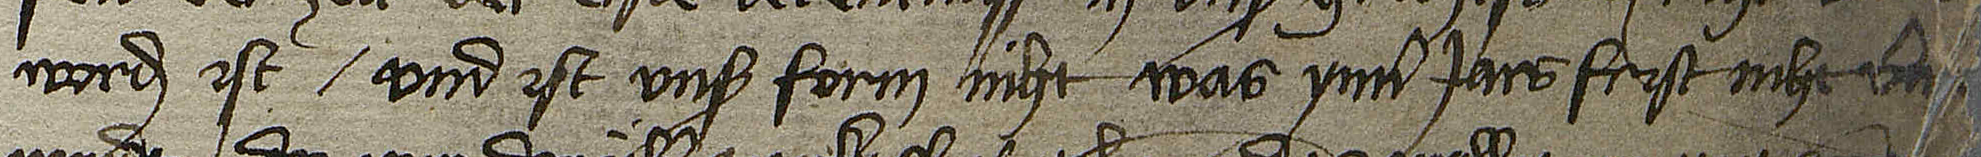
word* iſt / vnd iſt vnſ* form niht was ynn* Iars friſt niht v*n
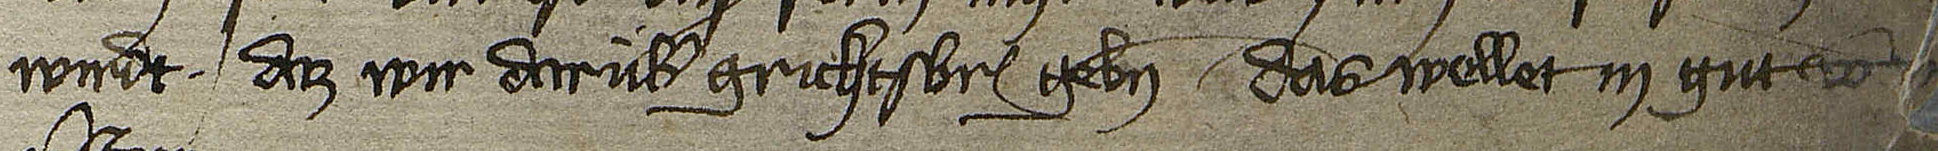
wirdt . daʒ wir darüb* grichtſbr* gebn* / das wellet in gut vo*
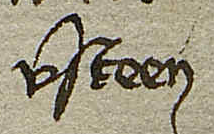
v*ſteen
